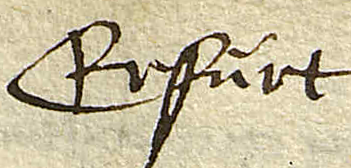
Erfürt
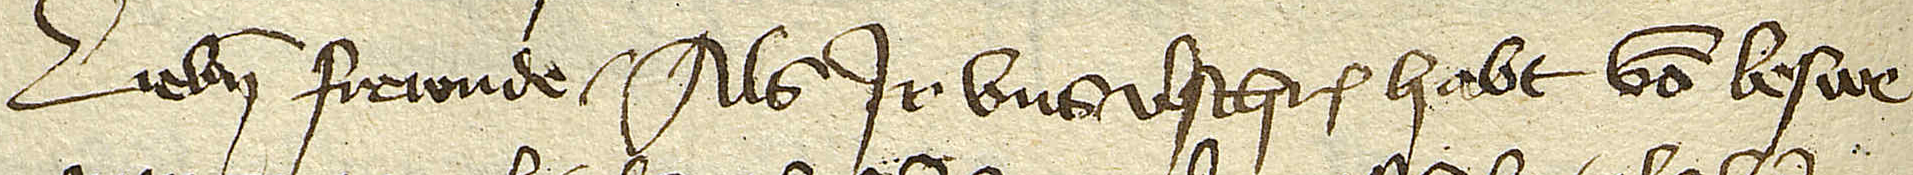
Liebn* frewnde / Als Ir vns v*ſchr* habt vo* beſwe
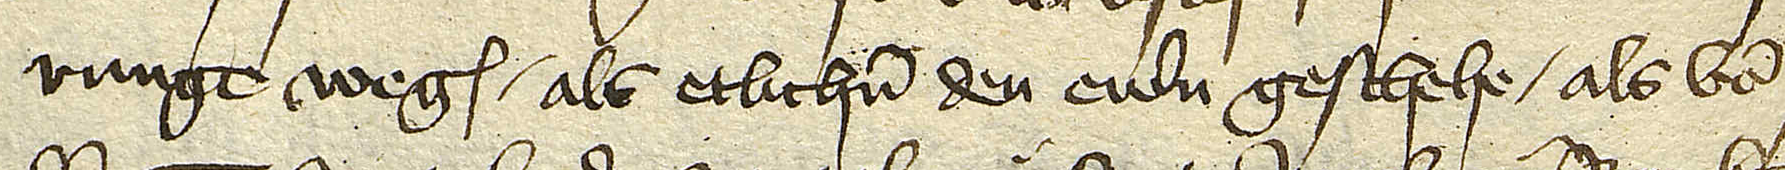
runge weg* / als etlichn* den ew*n geſchehe / als vo*
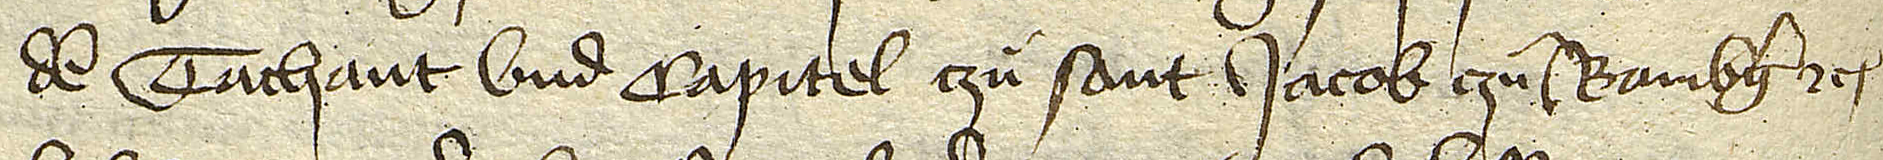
de* Tachant vnd Capitel cʒü ſant Iacob cʒü Bambg* ec*
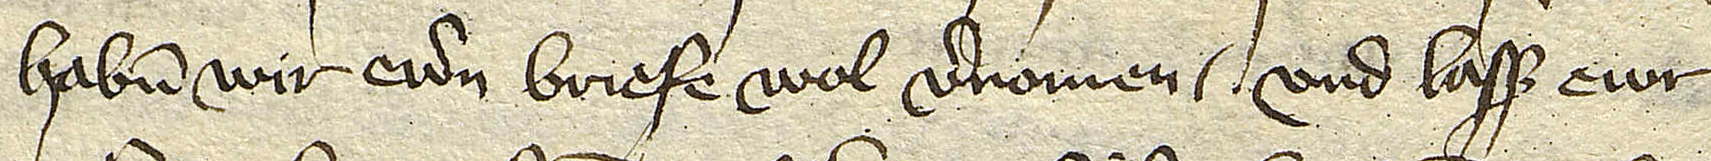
habn* wir ew*n briefe wol v*nomen / . vnd laſſ* ewr
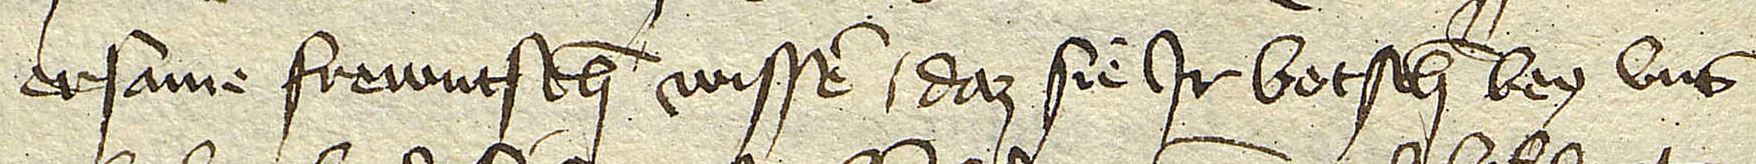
erſame frewntſch* wiſſe* / daʒ ſie Ir botſch* bey vns
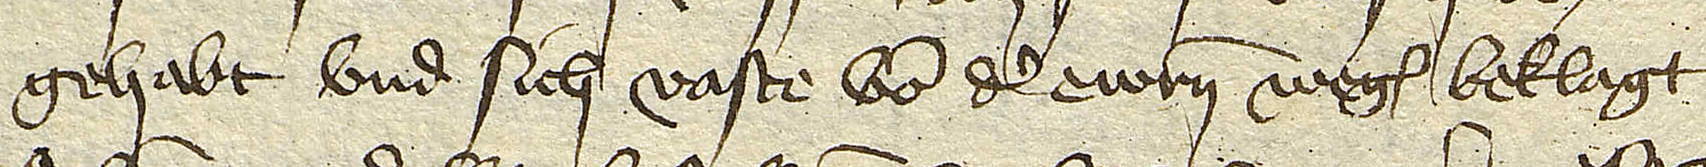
gehabt vnd ſich vaſte vo* d* ewrn* weg* beklagt
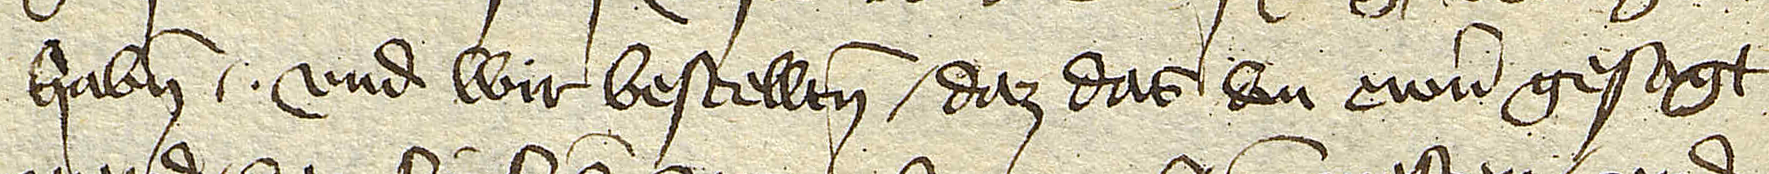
habn* / . vnd wir beſtelltn* / daʒ das den ewn* geſagt
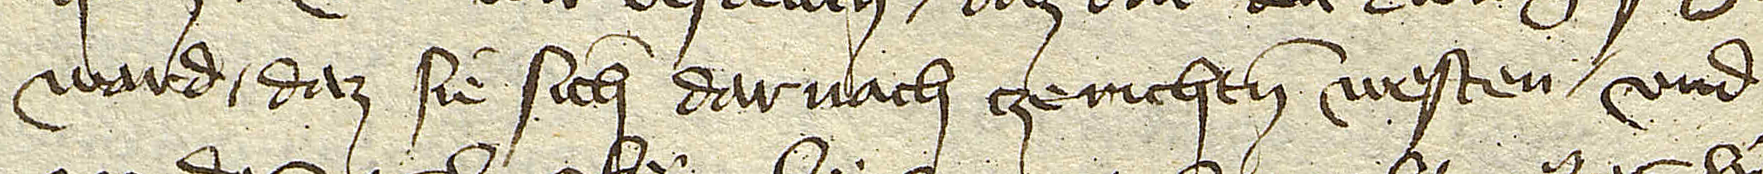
ward / daʒ ſie ſich darnach cʒerichtn* weſten / vnd
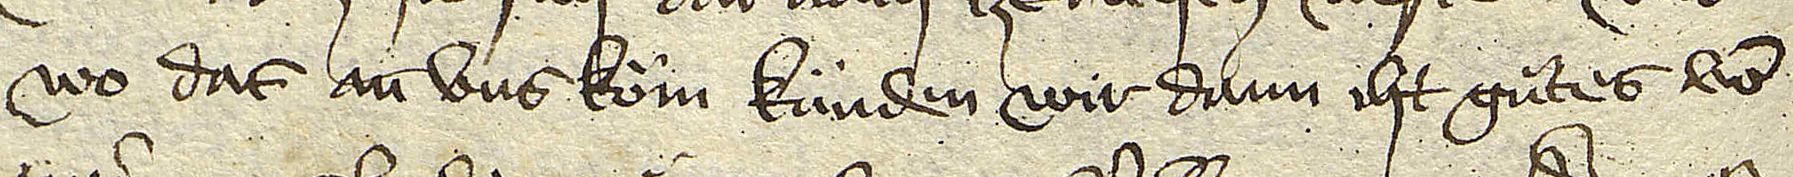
wo das an vns köm künden wir dann iht gutes vo*
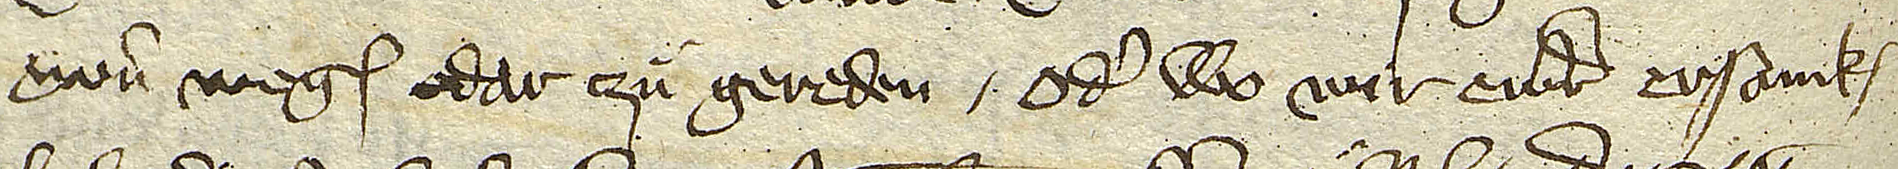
ewn* weg* dar* cʒü gereden / od* wo wir ewr* erſamk*
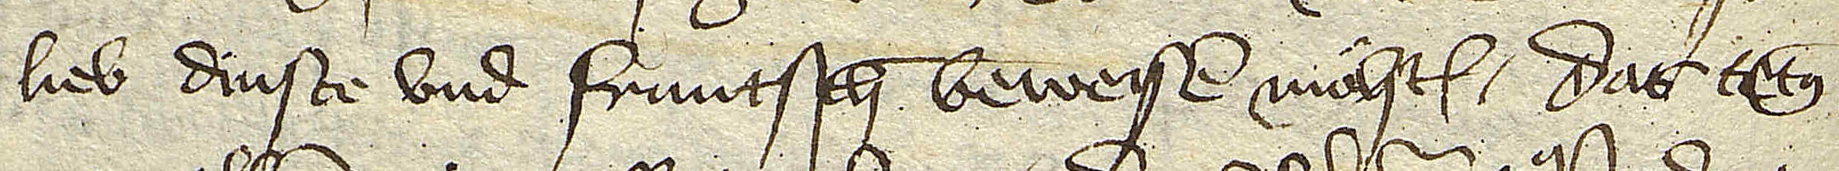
lieb dinſte vnd fruntſch* beweiſe* möht* / Das tetn*
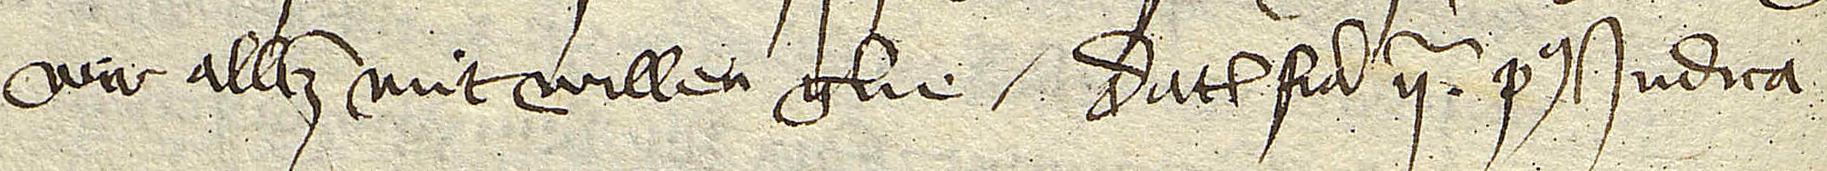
wir allcʒ* mit willen g*ne / Dat* ii*. p* Iudica
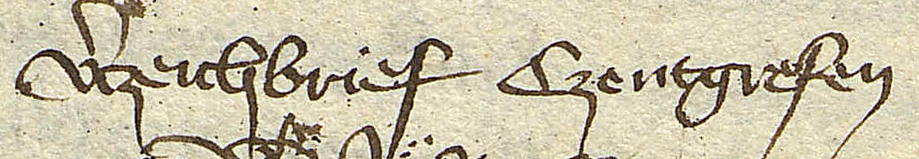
v*ʒeichbrief Cʒentgrefen
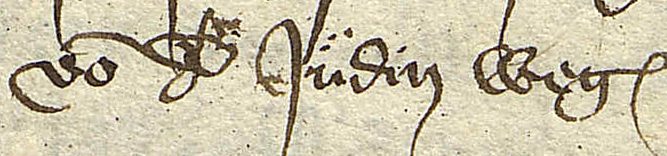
vo* d* Iüdin weg*
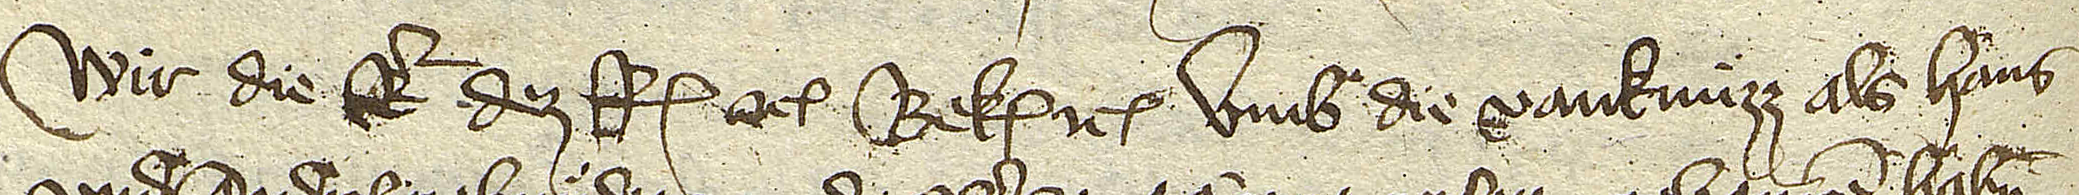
Wir die B* deʒ ff* ec* Bek* ec* Vmb die vanknüʒʒ als hans
